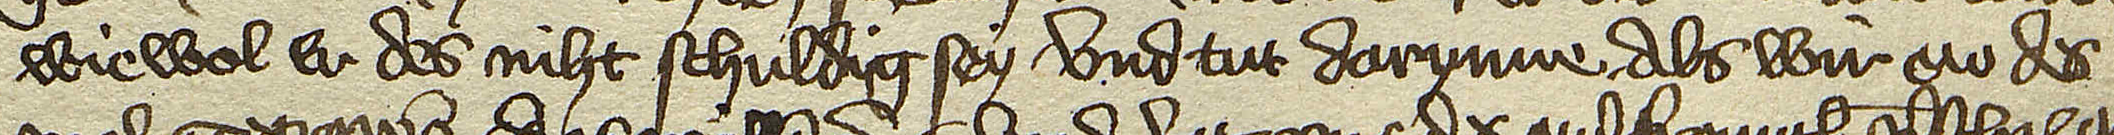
wie wol Er des niht ſchuldig ſey / vnd tut darynne Als wir ew des
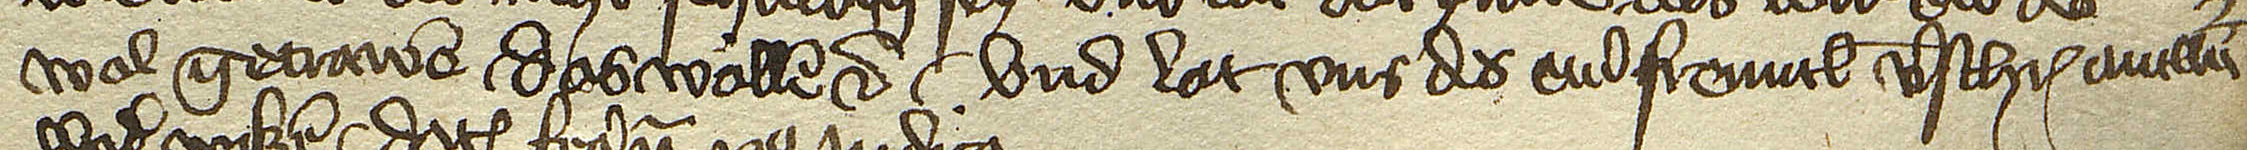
wol getrawe* / das wölle* ec* / vnd lat vns des ew* freuntl* v*ſchr* antw*t
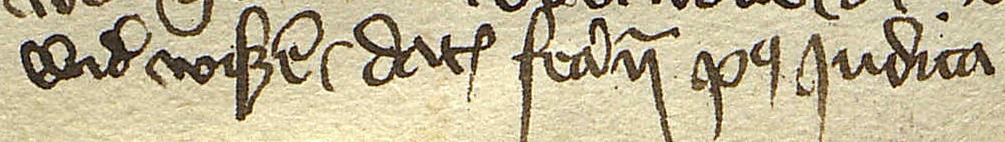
wid* wiſʒe* / dat* fea* ii* p* Iudica
